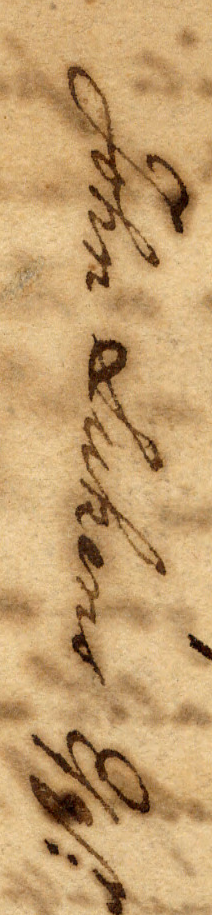John Lukens Esq^r:
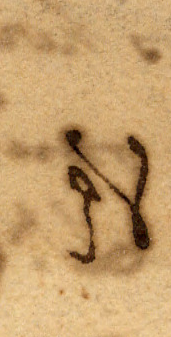To
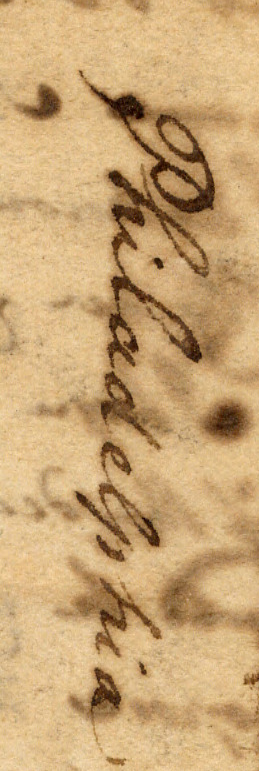Philadelphia
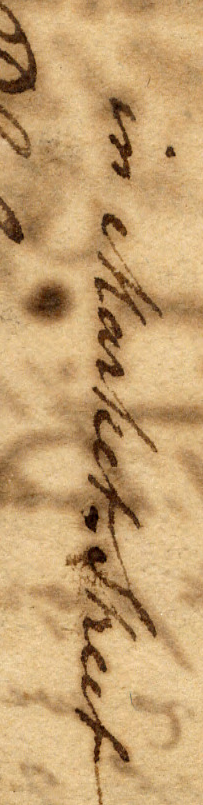in Market Street
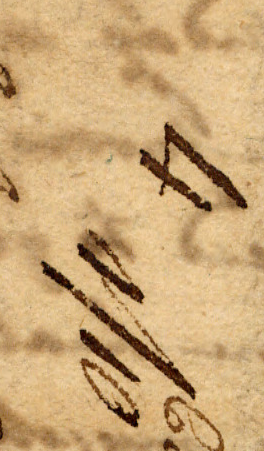4 1/10
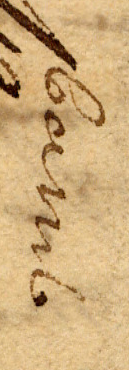Camb
